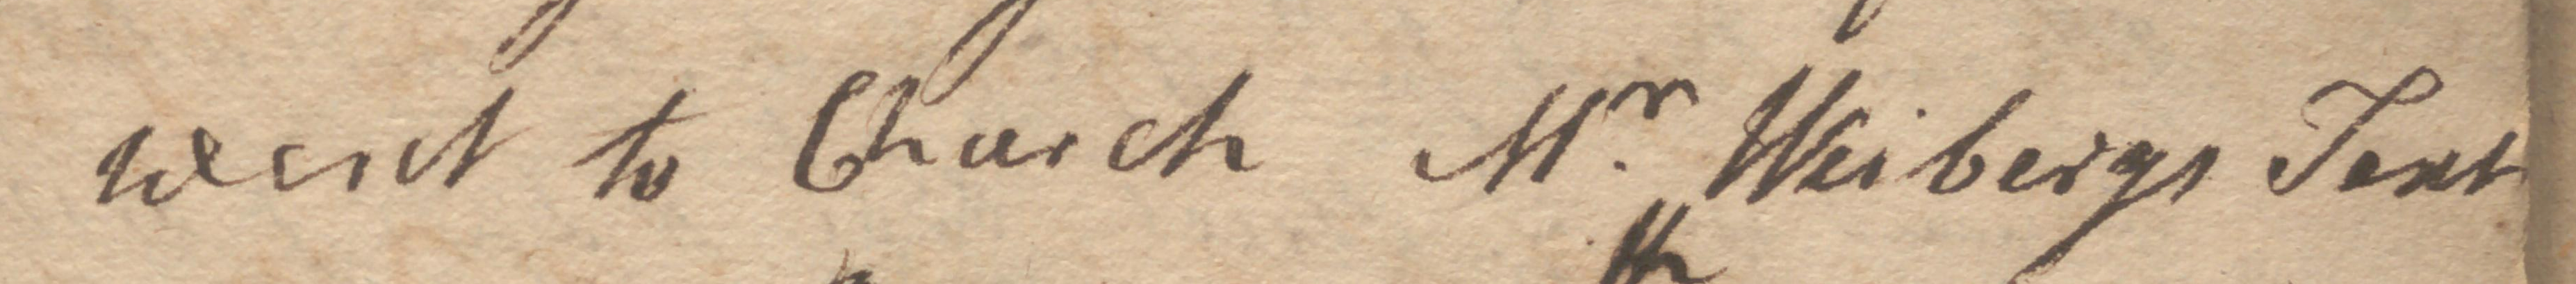went to Chusch M^r. Weibergs Text
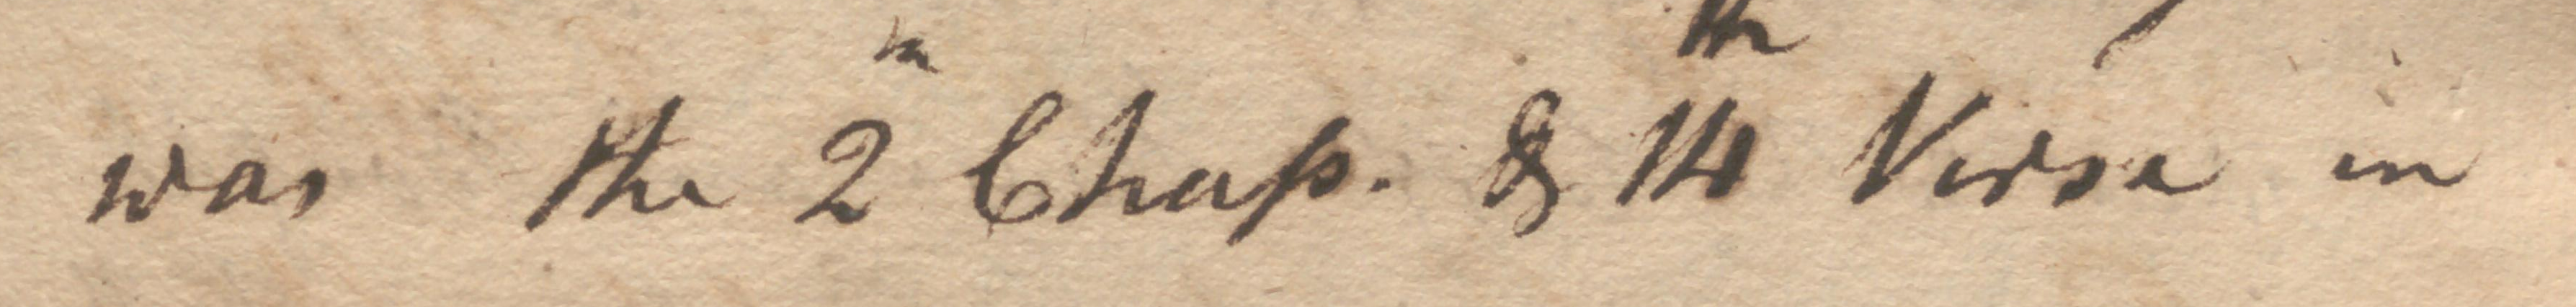was the 2^th Chap. & 14^th Verse in
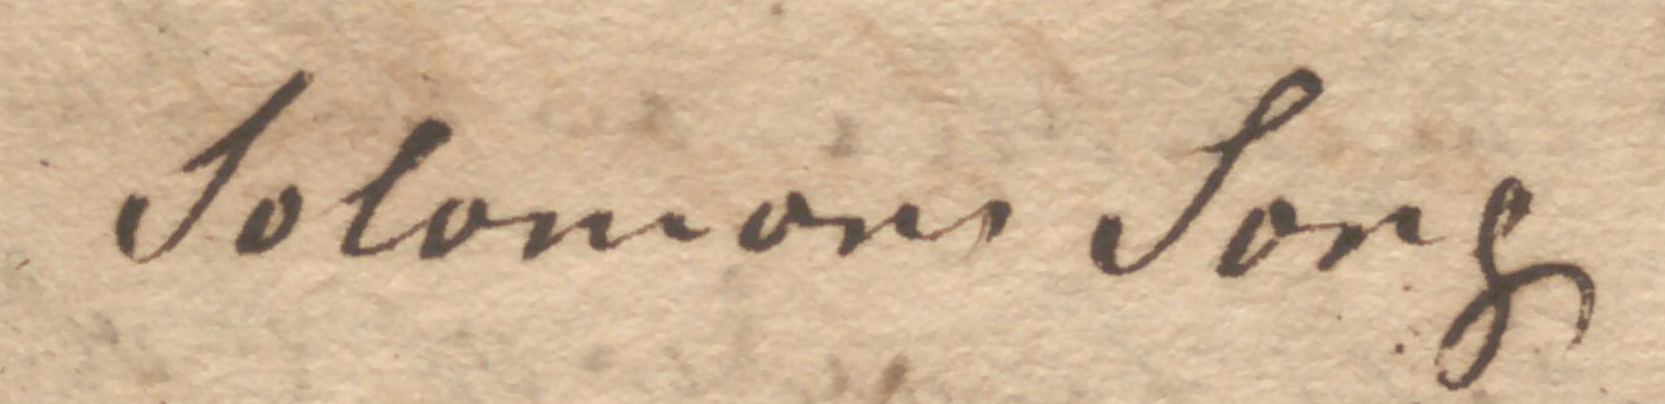Solomons Song
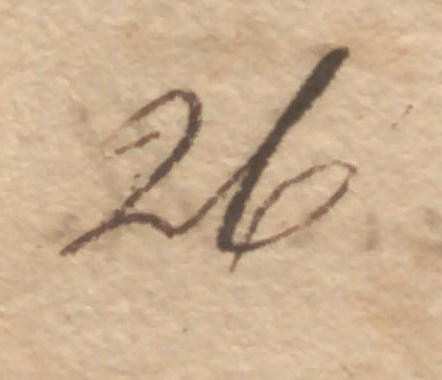26
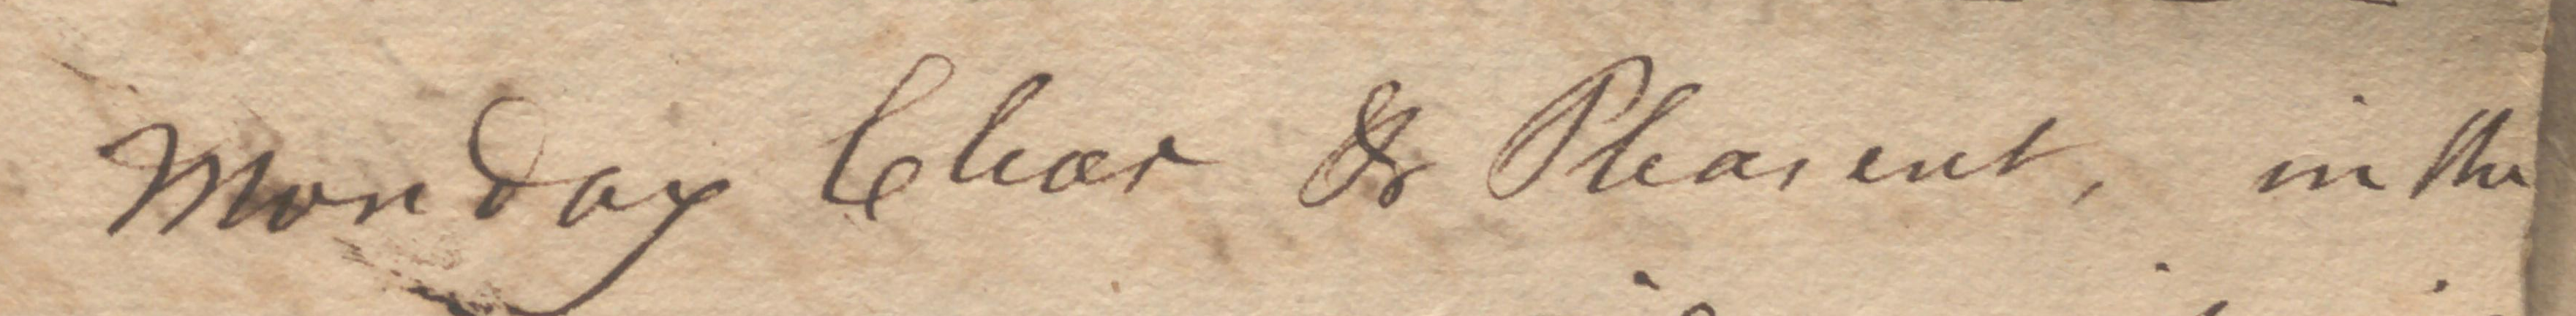Monday Clear & Pleasent, in the
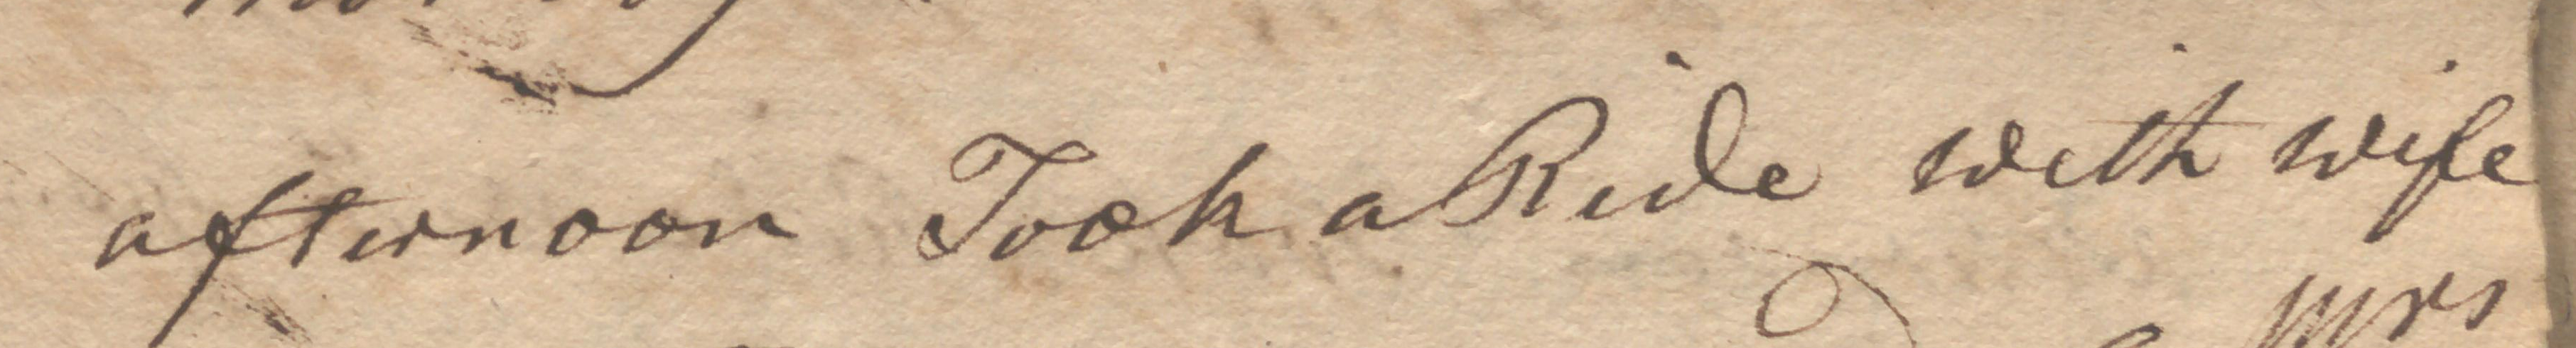afternoon Took a Ride with wife
